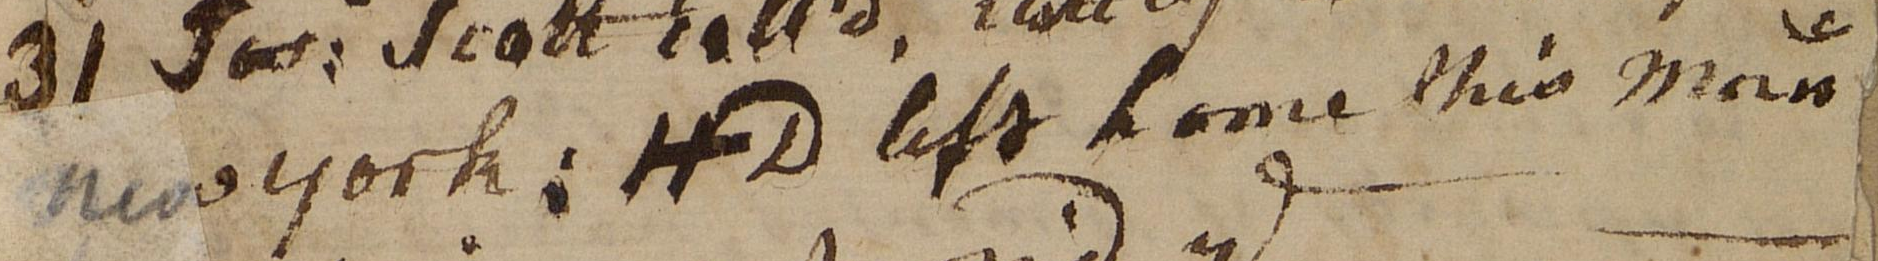New York: HD left home this morn^g
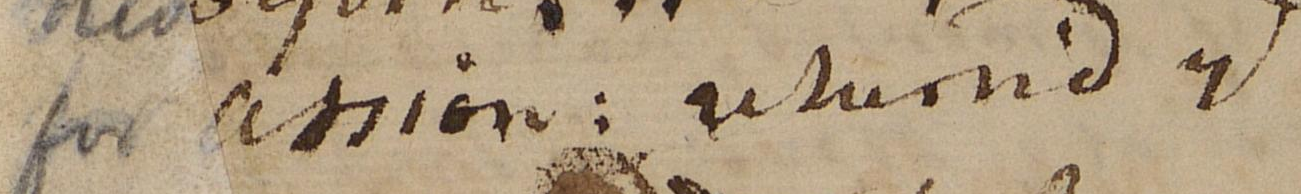for Atsion: return'd y^e
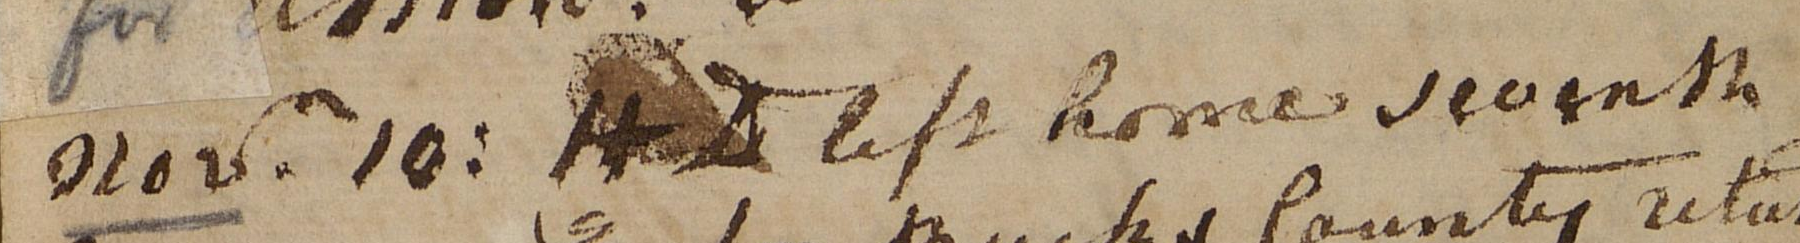Nov^r. 10: HD left home seventh
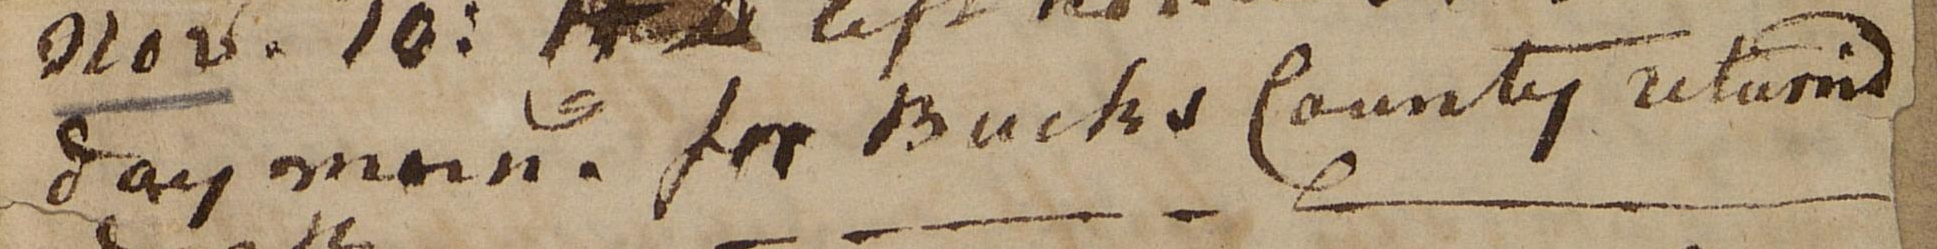day morn^g. for Bucks County return'd
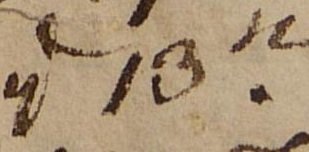y^e 13^th.
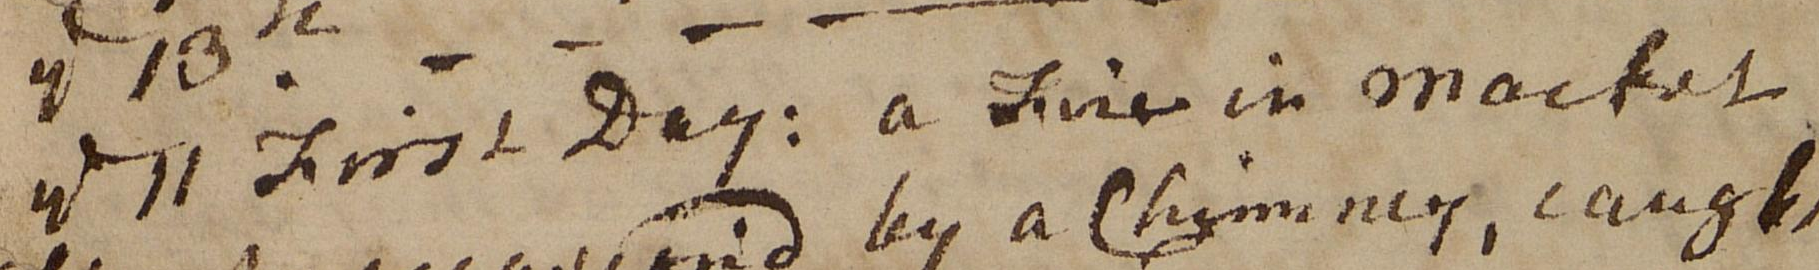y^e 11 First Day: a Fire in market
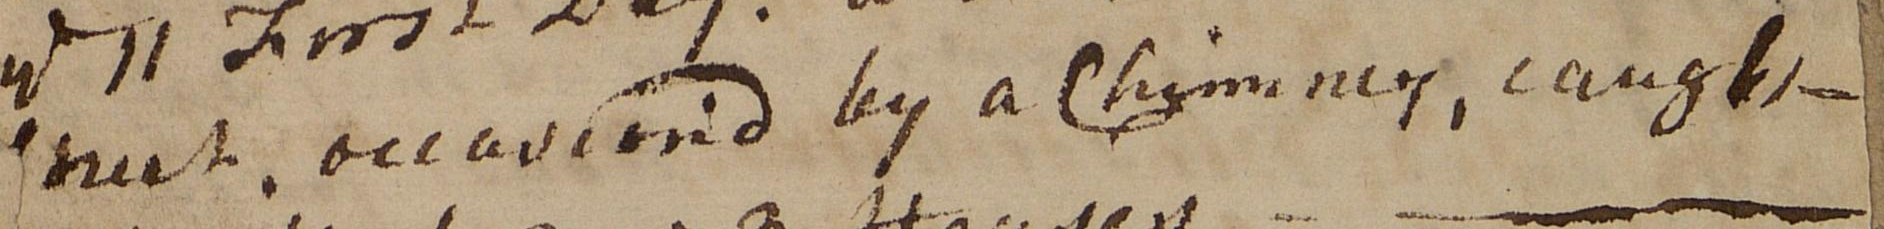Street, occasion'd by a Chimney, caught
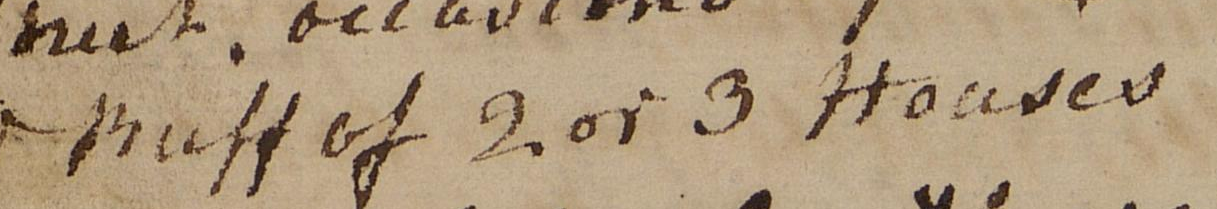y^e Ruff of 2 or 3 Houses
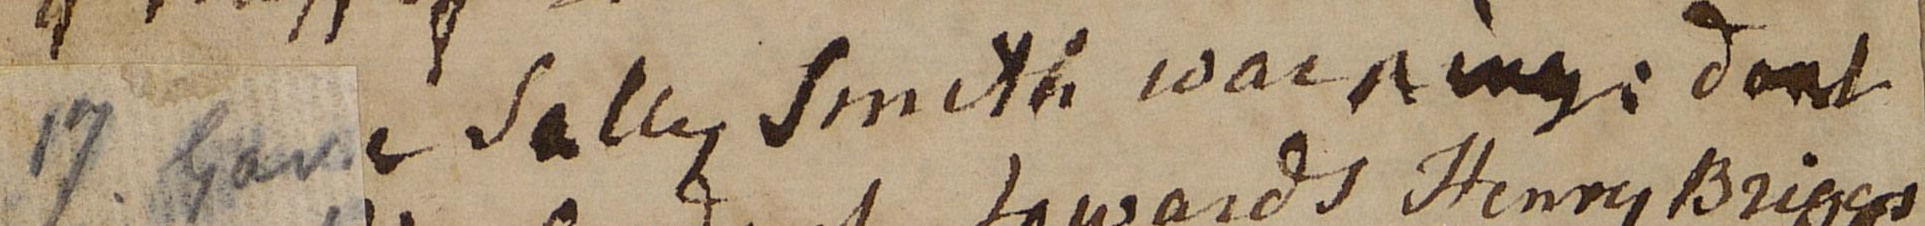17 Gave Sally Smith warning: dont
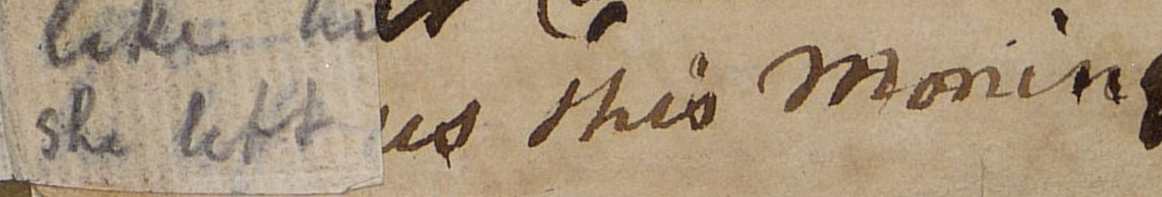she left us this moning
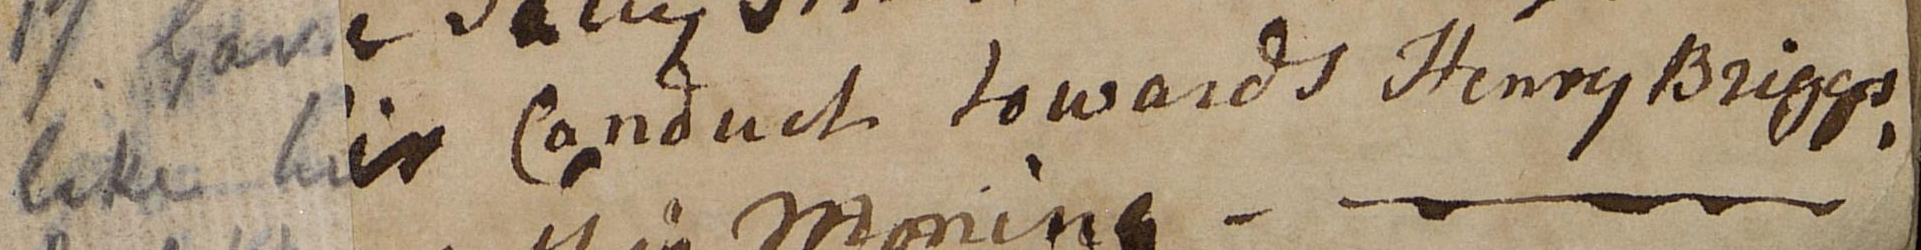like his Conduct towards Henry Briggs,
